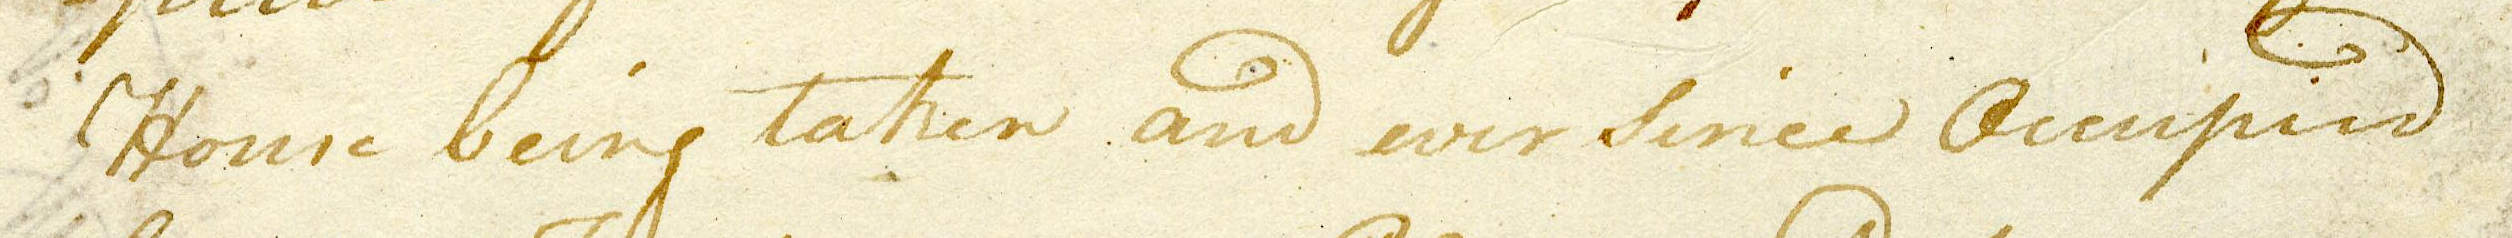House being taken and ever since occupied
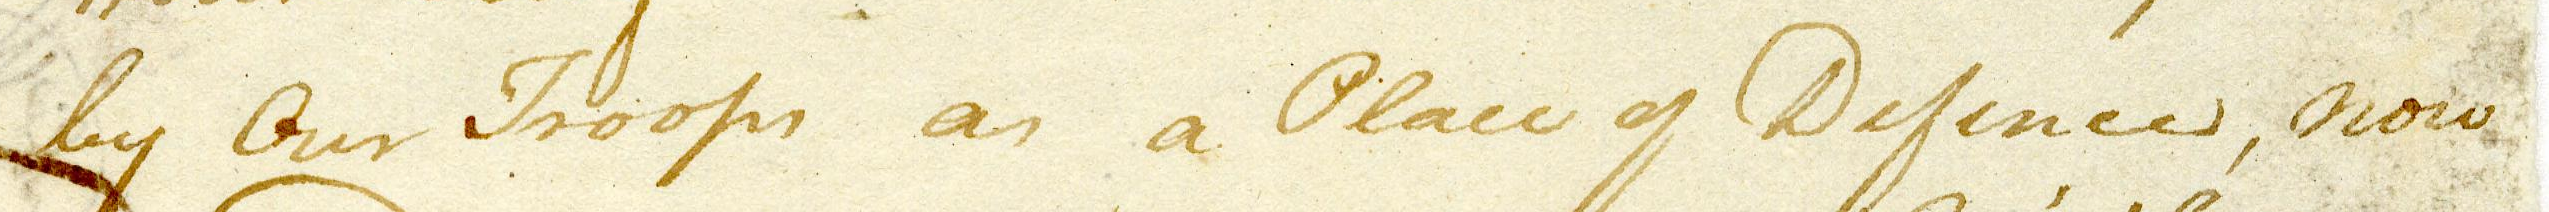by Our Troops as a Place of Defences, now
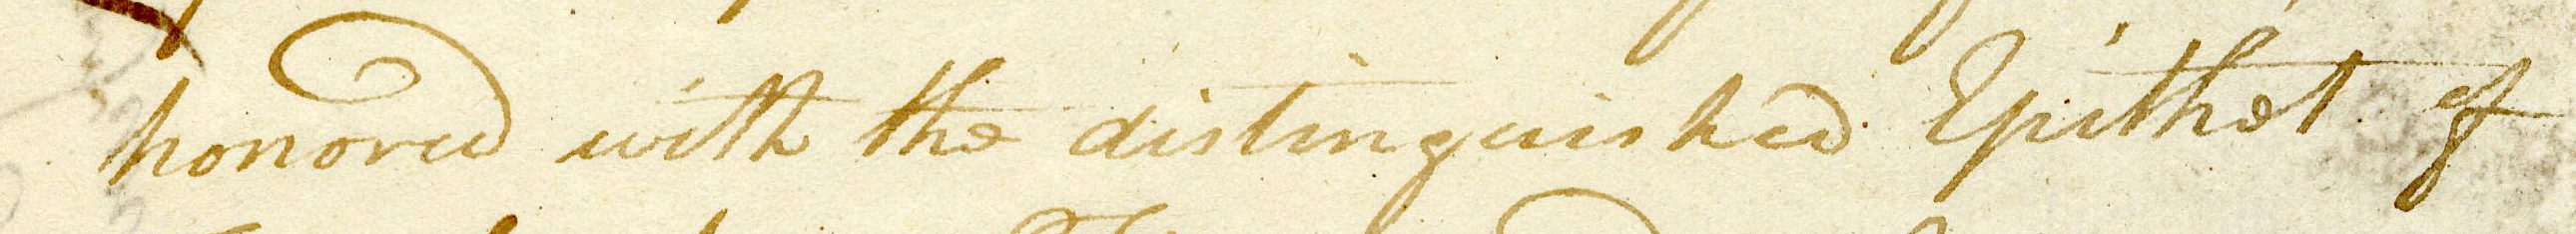honored with the distinguished Epithet of
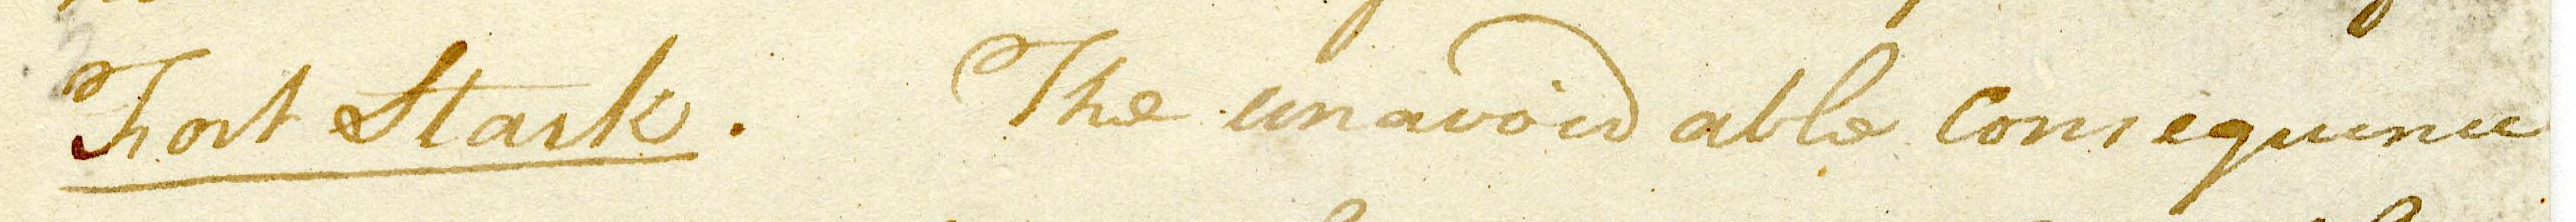Fort Stark. The unavoidable consequence
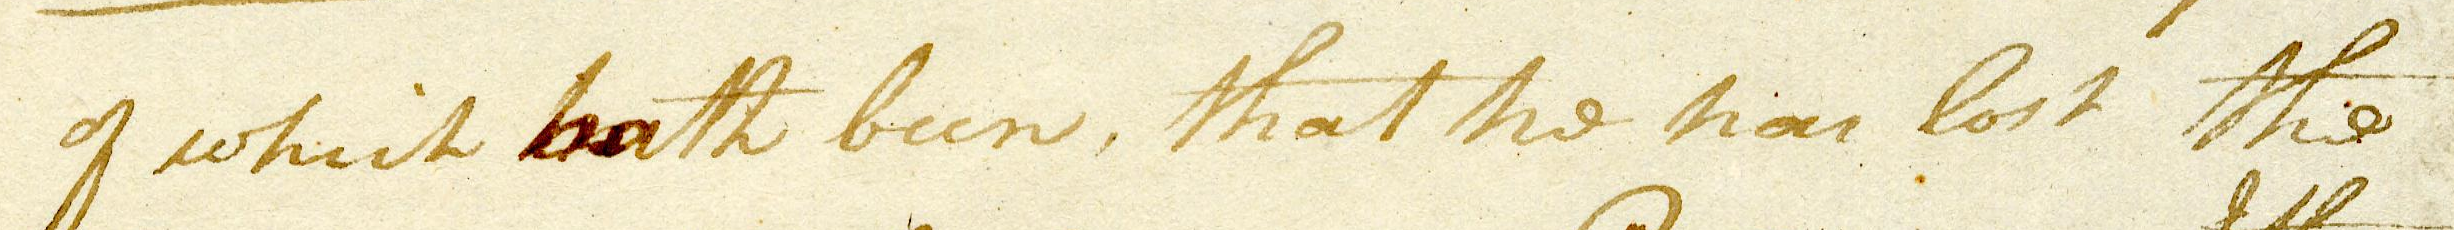of wihc hath been, that he has lost the
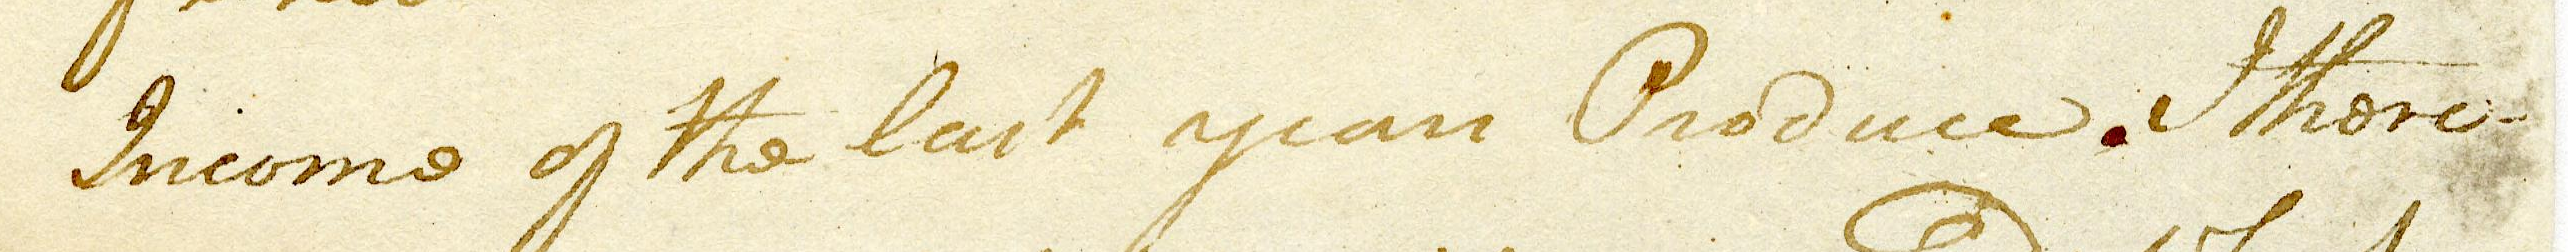Income of the last years Produce. I there-
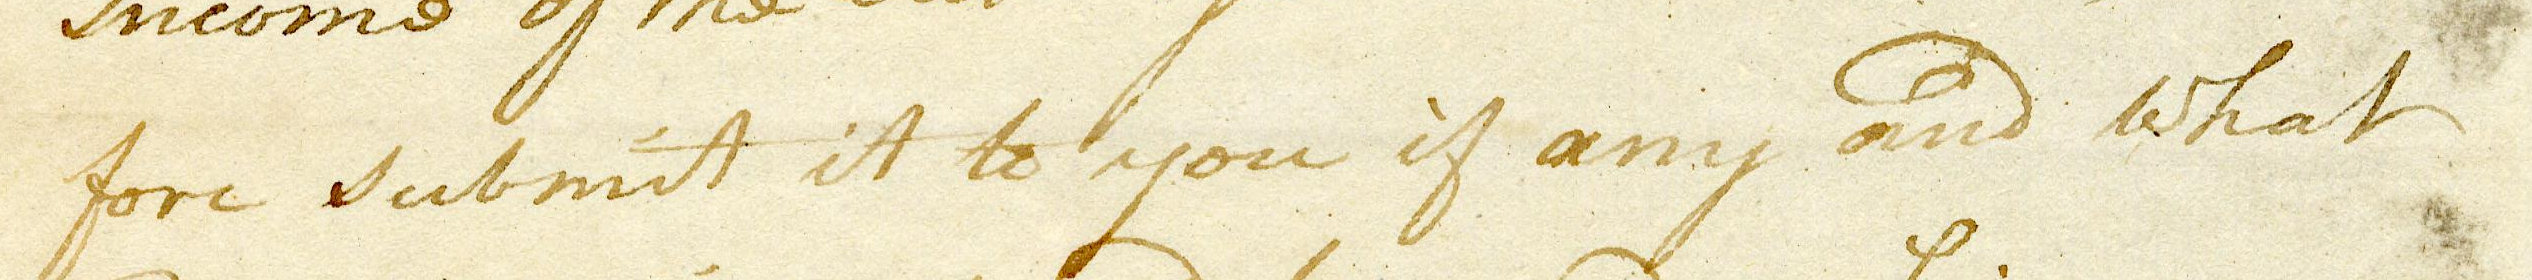fore submit it to you if any and what
